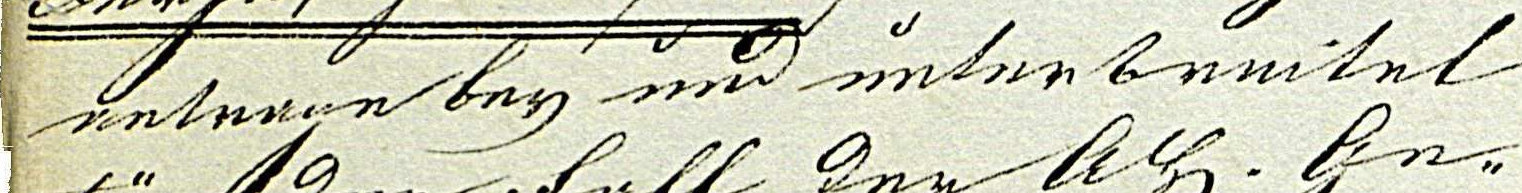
antrage bey und unterbreitet
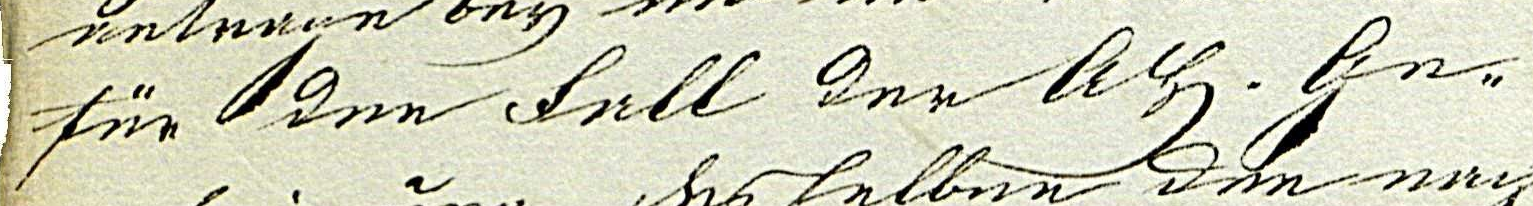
für den Fall der AH Ge¬
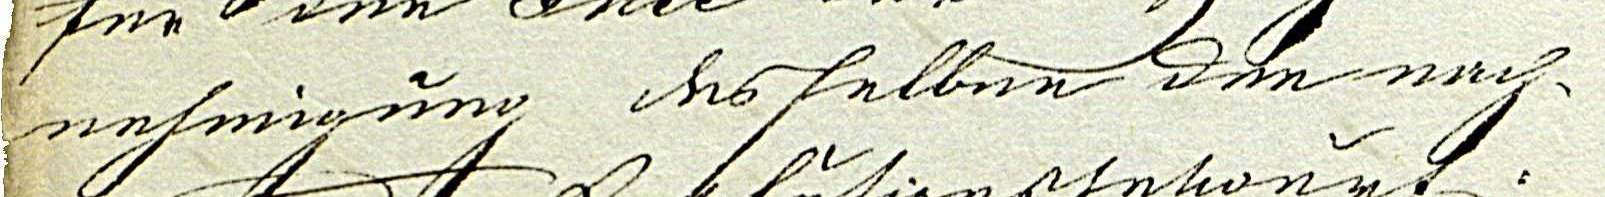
nehmigung desselben den nach¬
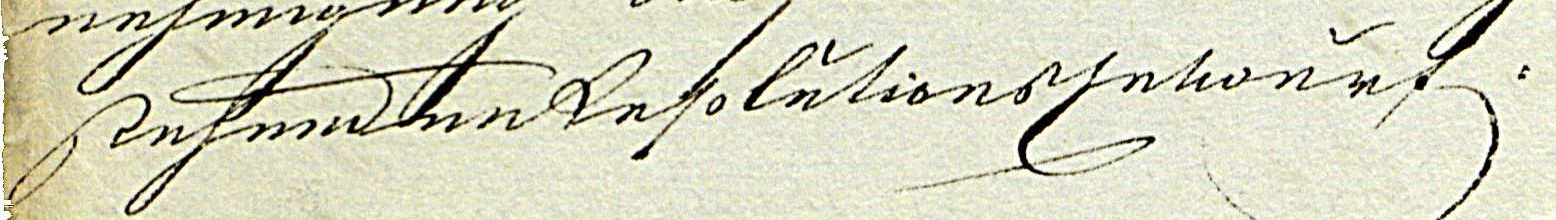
stehenden Resolutionsentwurf.
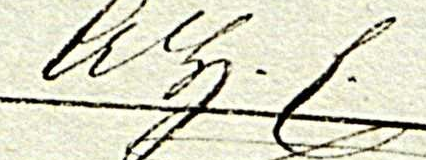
Ah. E.
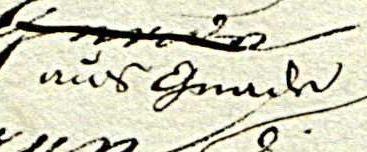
aus Gnade
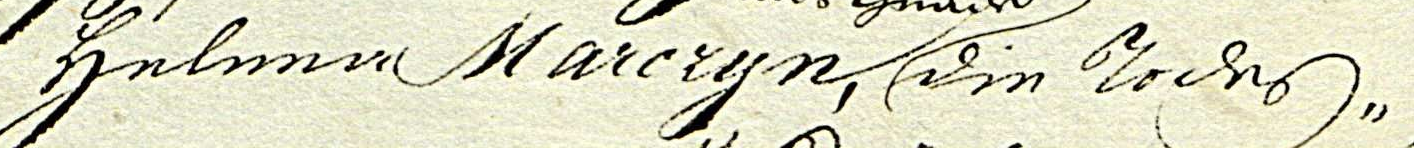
Helena Marczyn, die Todes¬
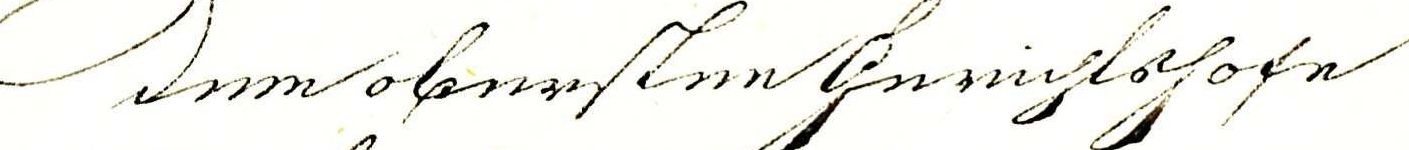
dem obersten Gerichtshofe
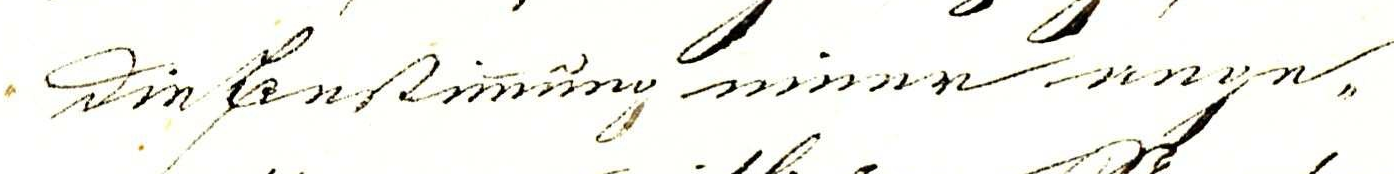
die Bestimmung einer ange¬
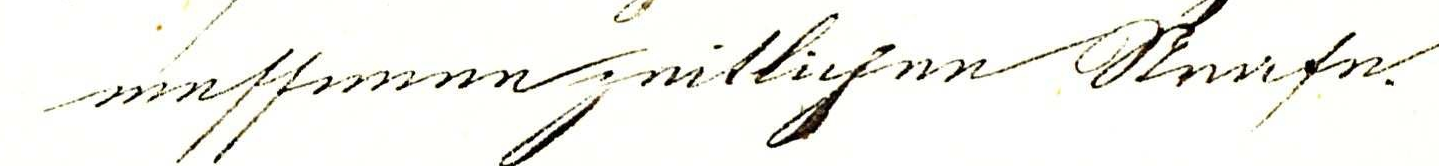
messenen zeitlichen Strafe.
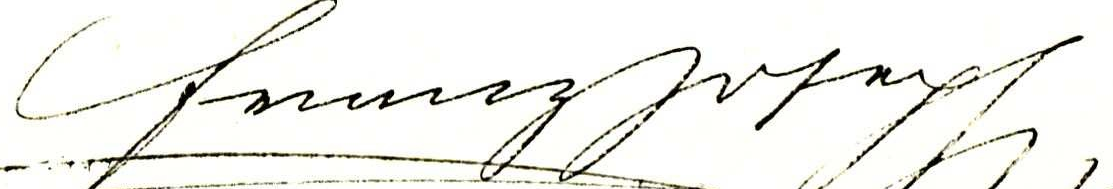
Franz Joseph
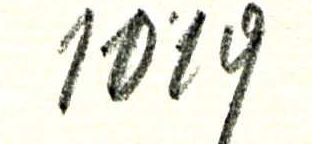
1019
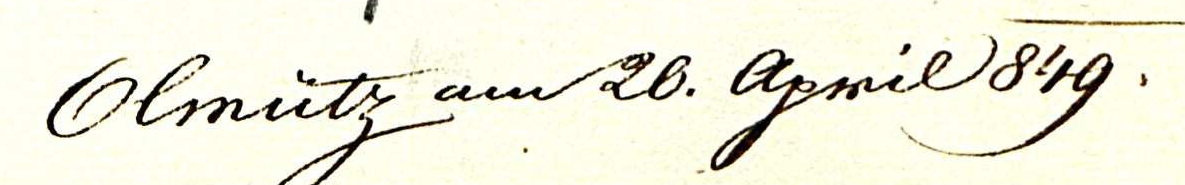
Olmütz am 20. April 1849
